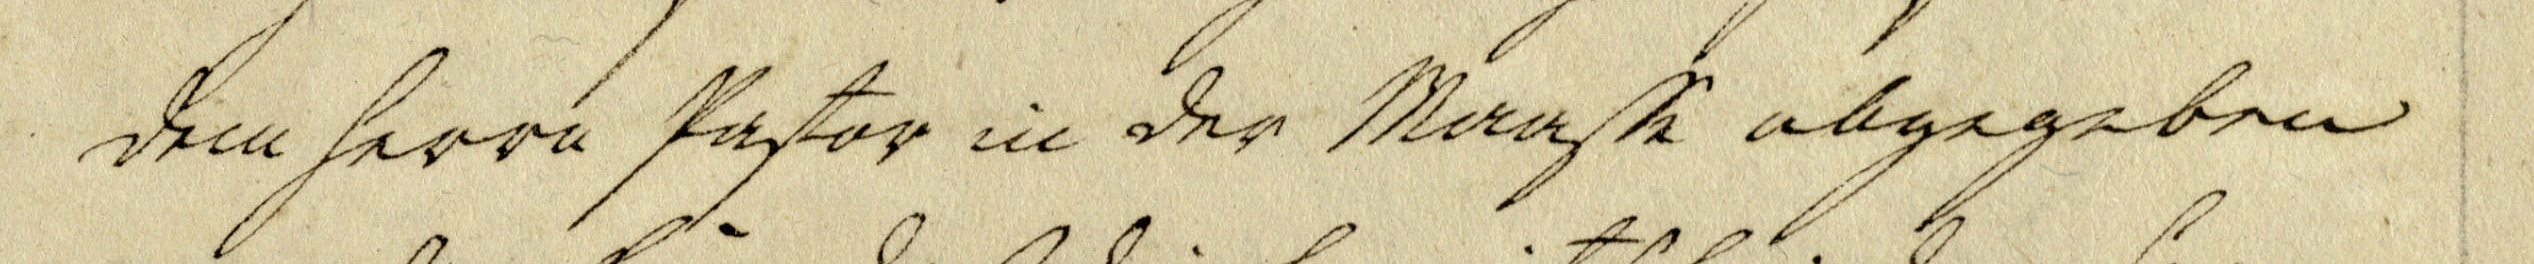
dem Herrn Pastor in der Maasse abgegeben
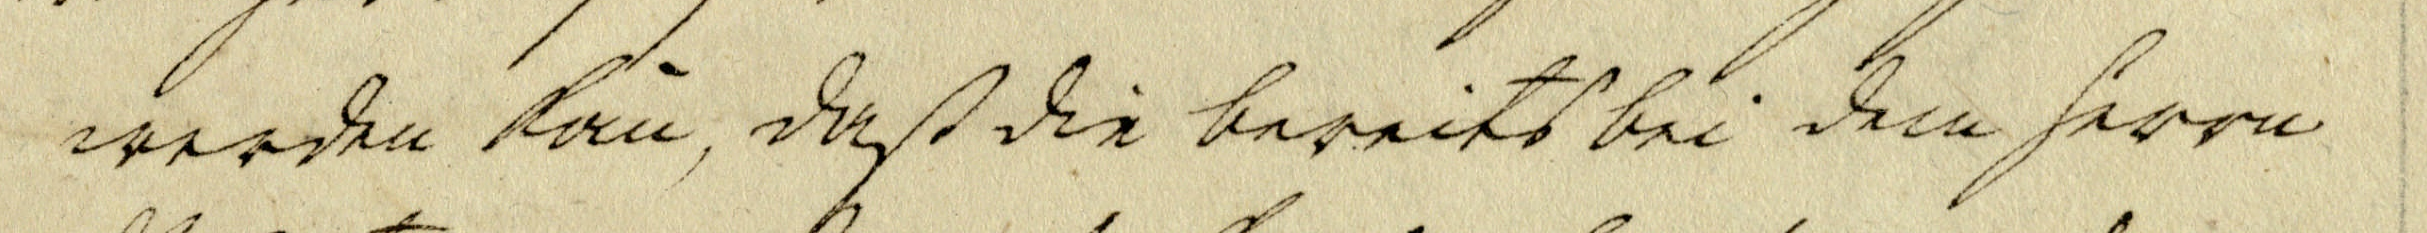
werden kan, daß die bereits bei dem Herrn
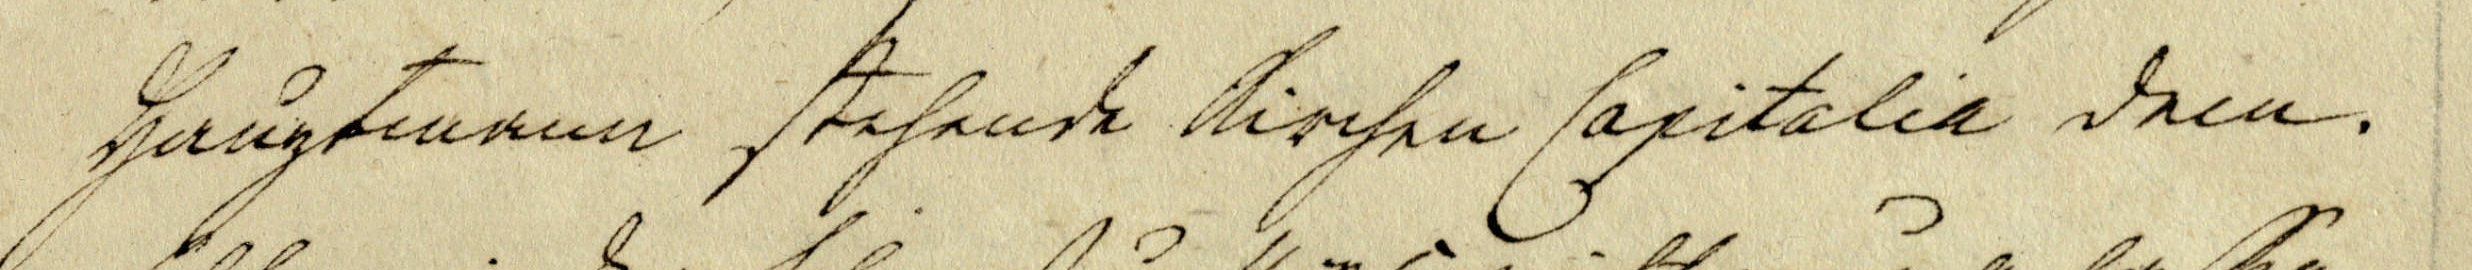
Hauptmann stehende Kirchen Capitalia dem¬
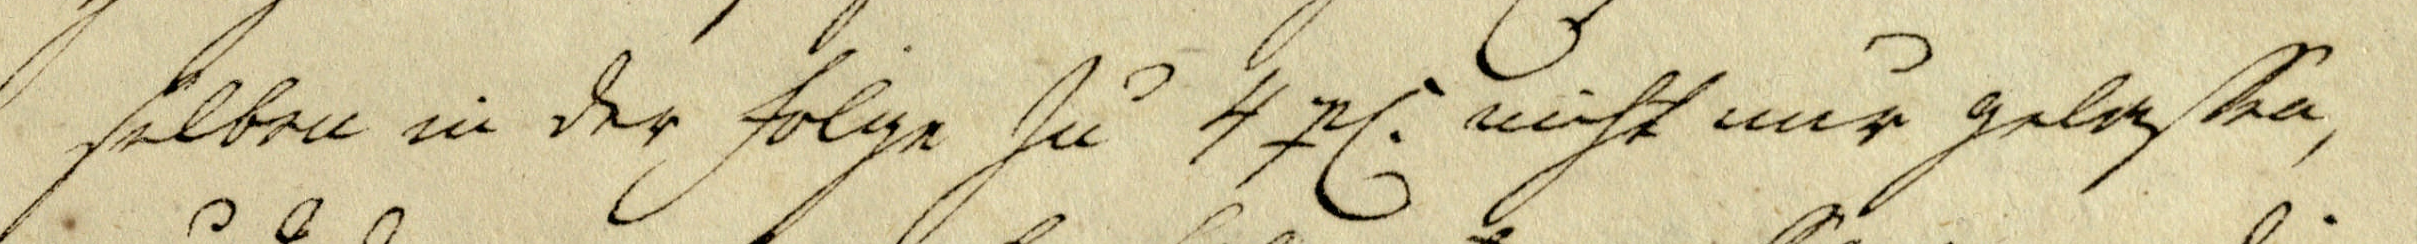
selben in der Folge zu 4 pl. nicht nur gelassen,
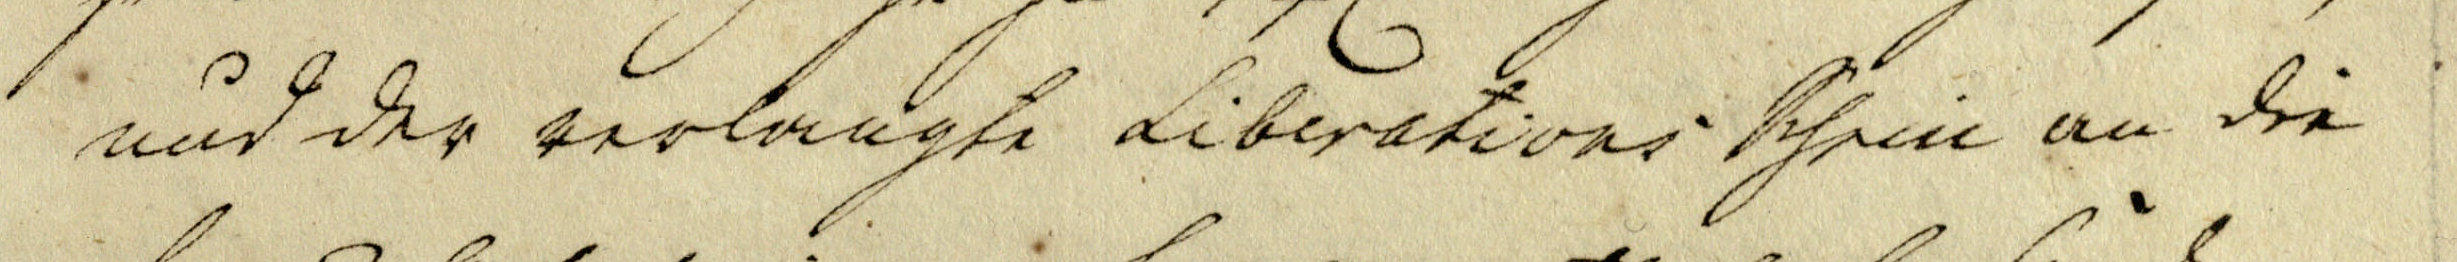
und der verlangte Liberations Schein an die
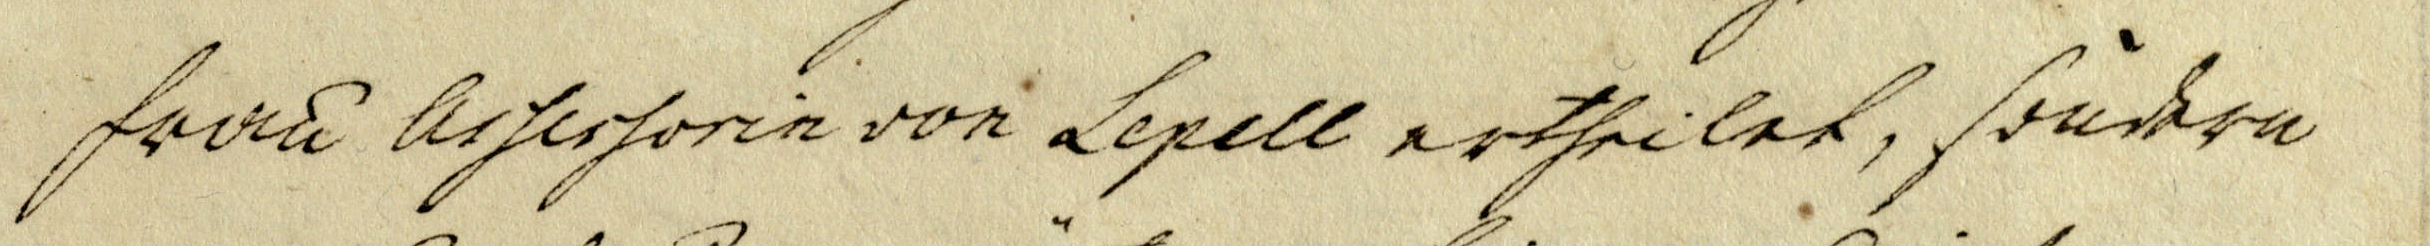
Frau Assessorin von Lepell ertheilet, sondern
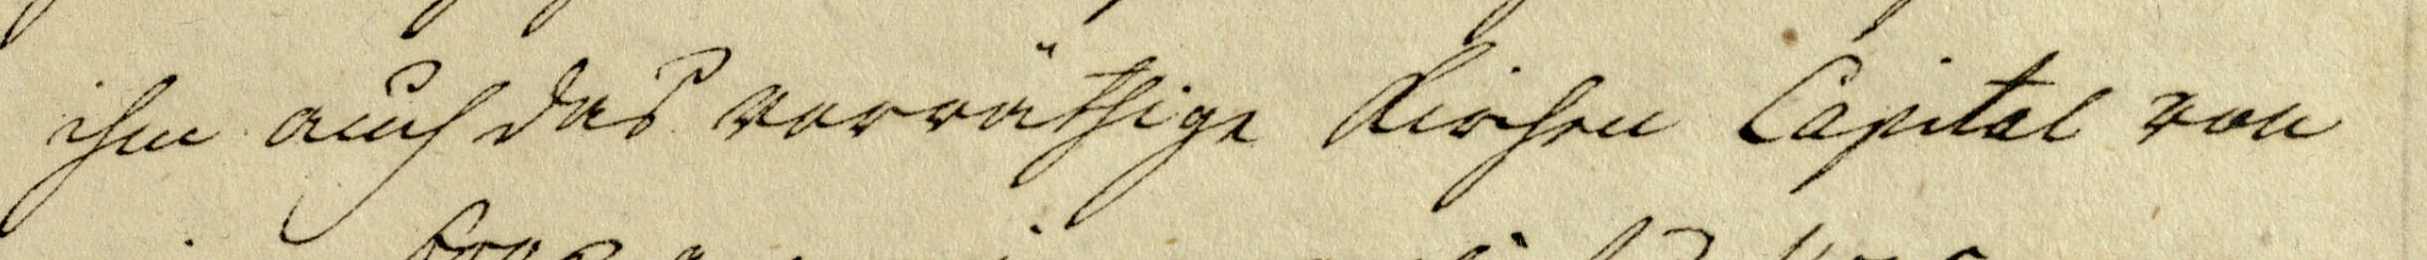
ihm auch das vorräthige Kirchen Capital von
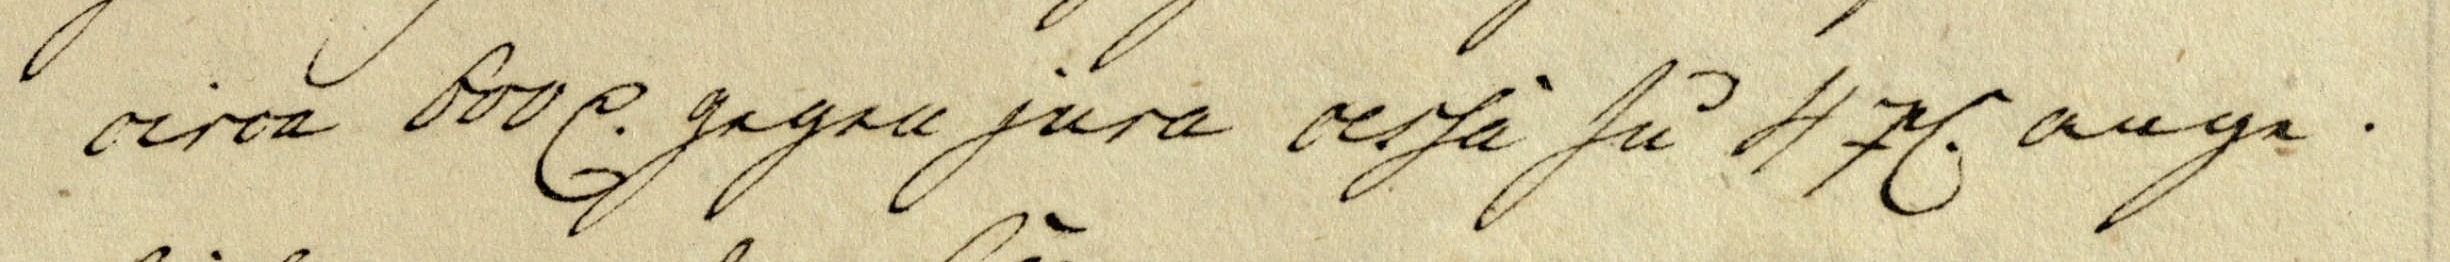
circa 600 l. gegen jura cessa zu 4 pl. ange¬
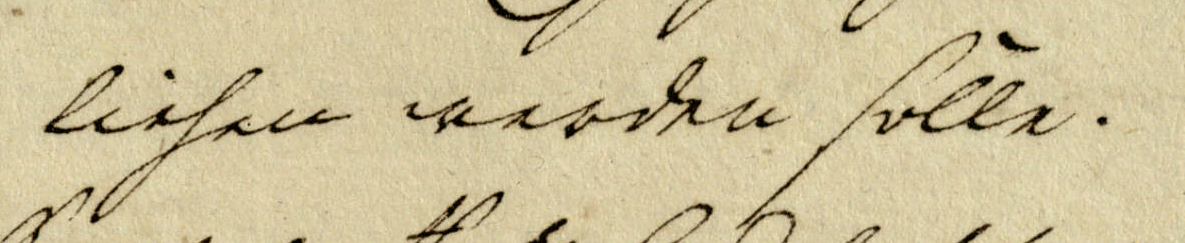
liehen werden solle.
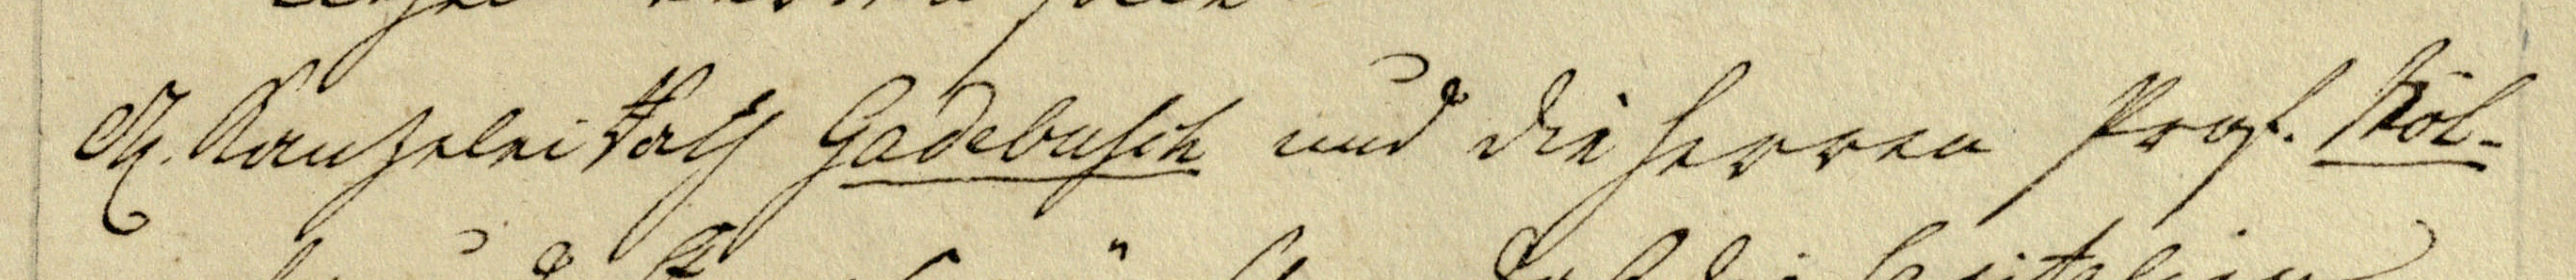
dh. KanzeleiRath Gadebusch und die Herren Prof. Möl¬
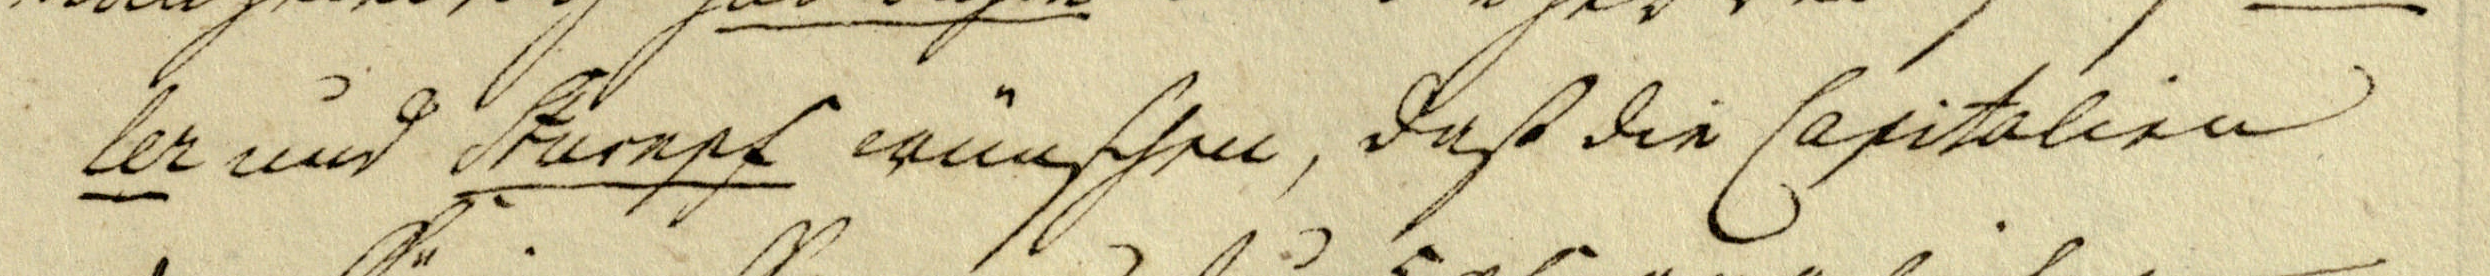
ler und Stumpf wünschen, daß die Capitalien
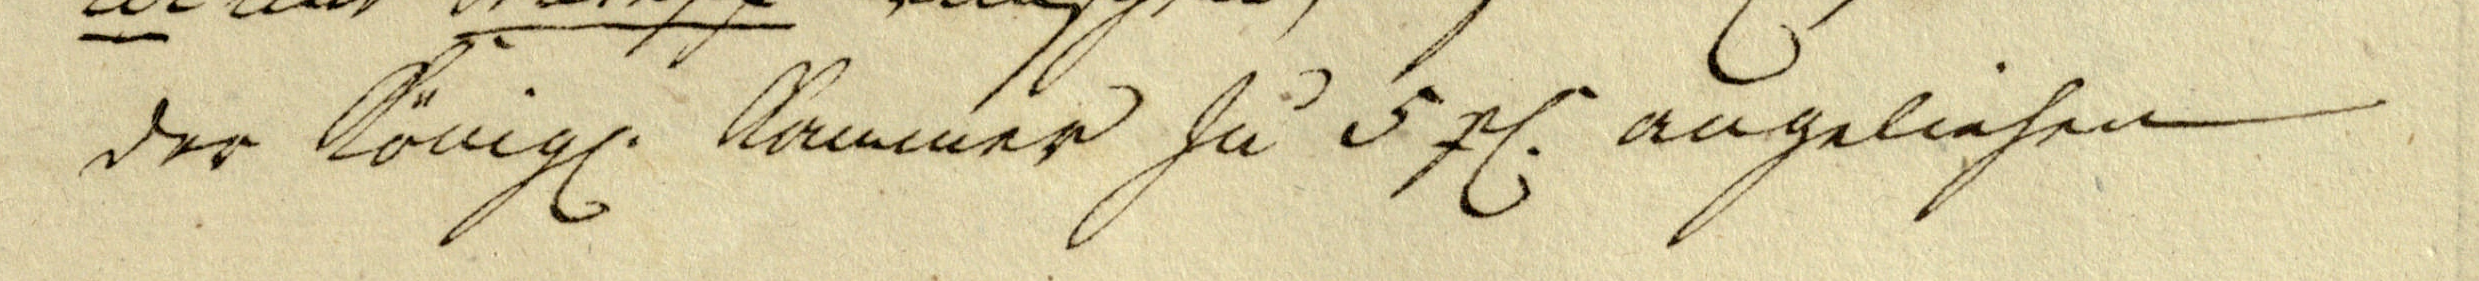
der Königl. Kammer zu 5 pl. angeliehen
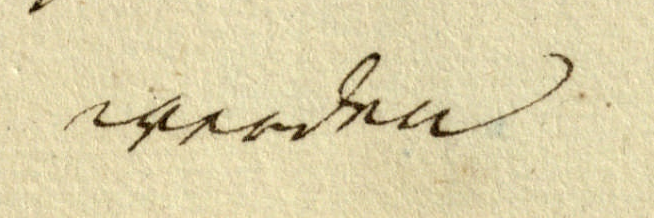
werden
